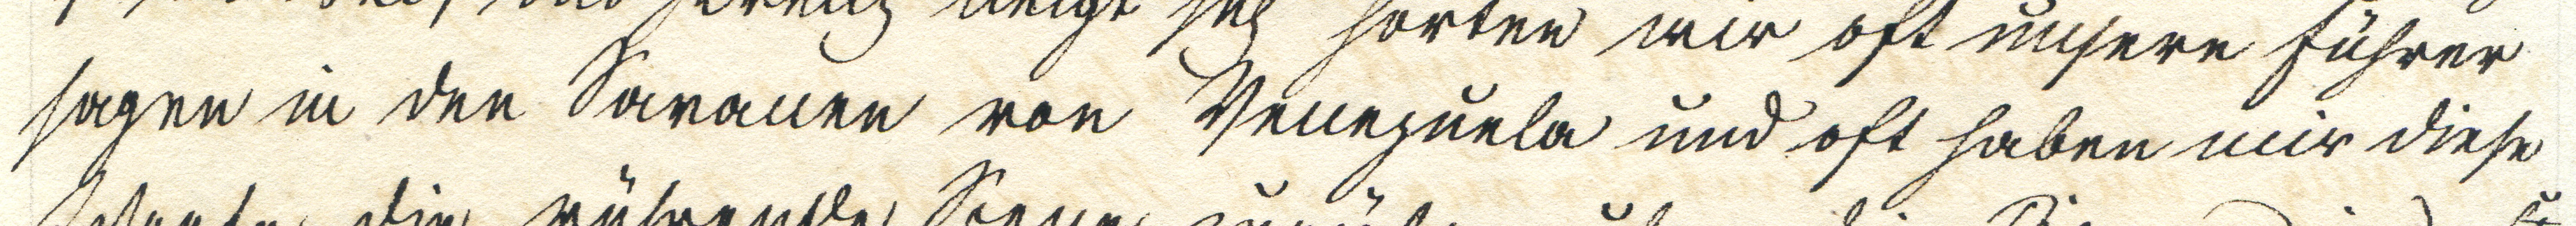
sagen in den Savannen von Venezuela und oft haben mir diese
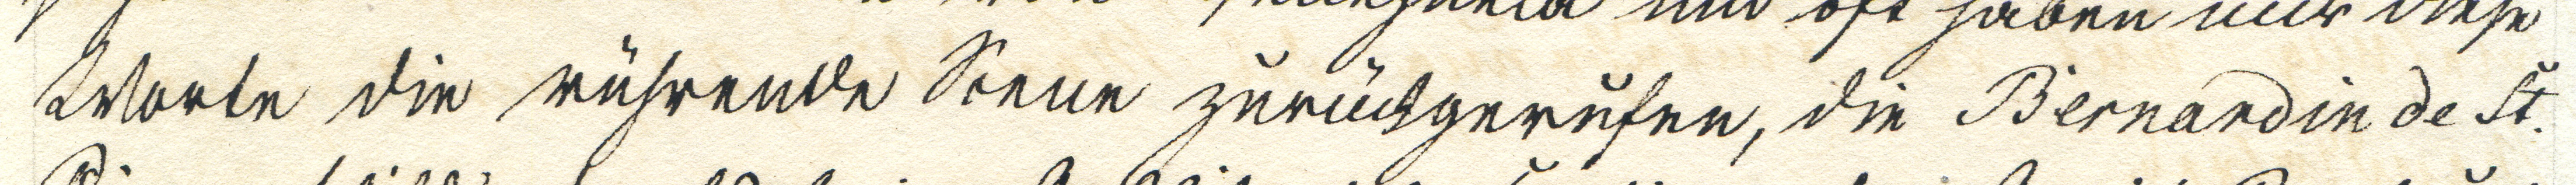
Worte die rührende Scene zurückgerufen, die Bernardin de St.
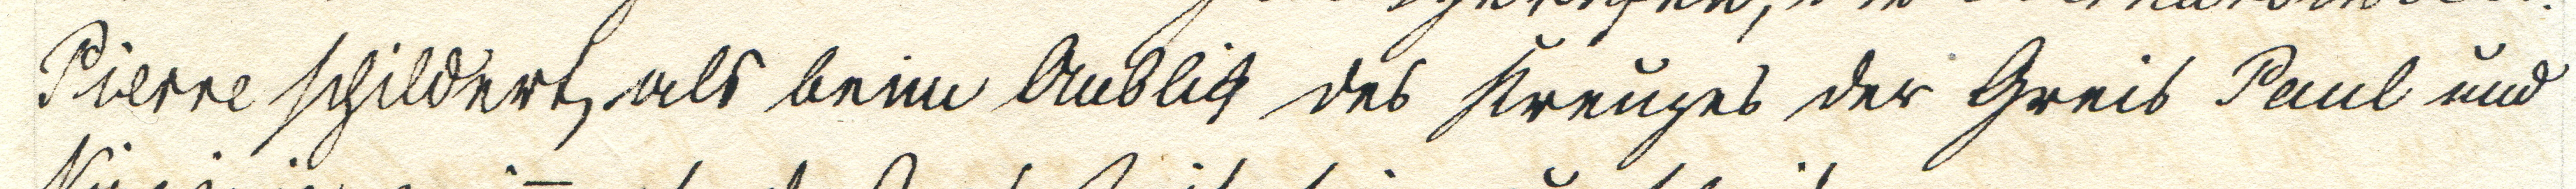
Pierre schildert, als beim Anblick des Kreuzes der Greis Paul und
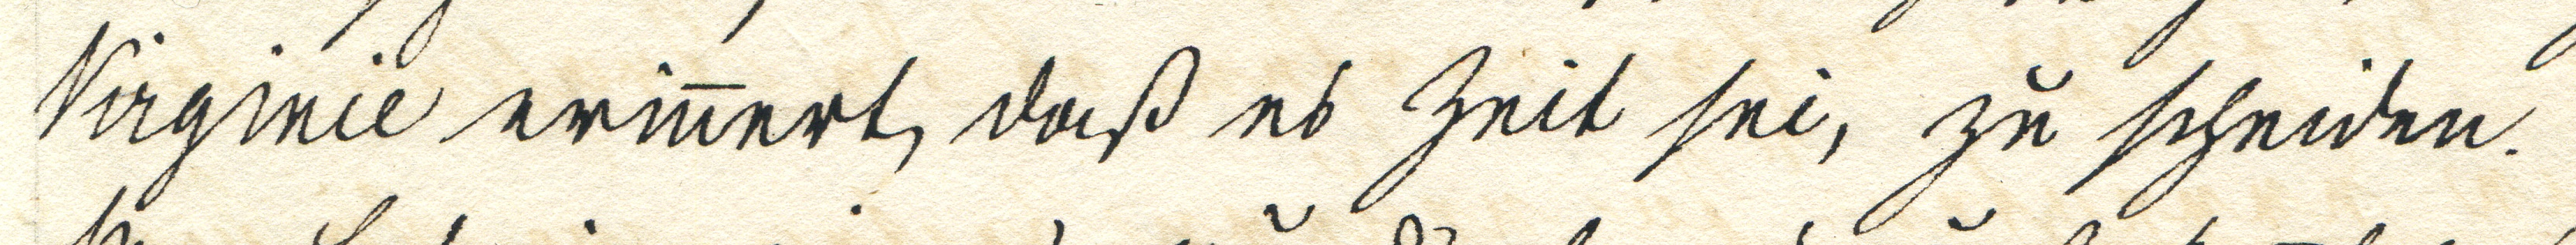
Virginie eriñert, daß es Zeit sei, zu scheiden.
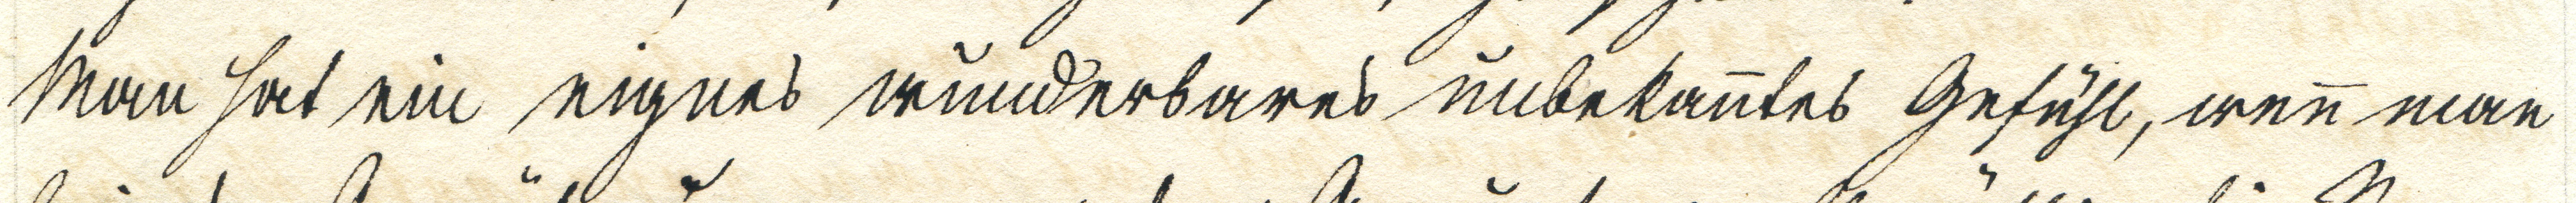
Man hat ein eignes wunderbares unbekañtes Gefühl, weñ man
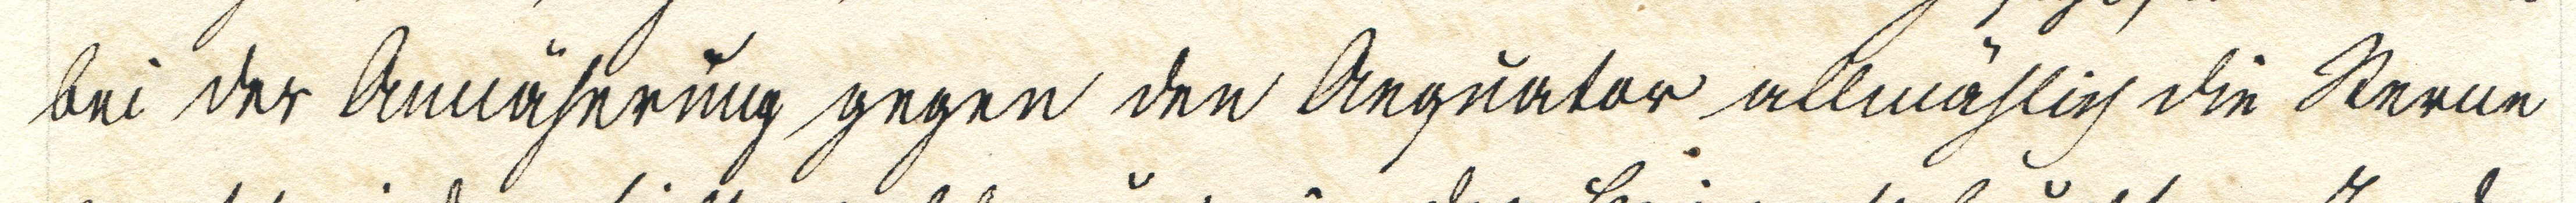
bei der Annäherung gegen den Aequator allmählich die Sterne
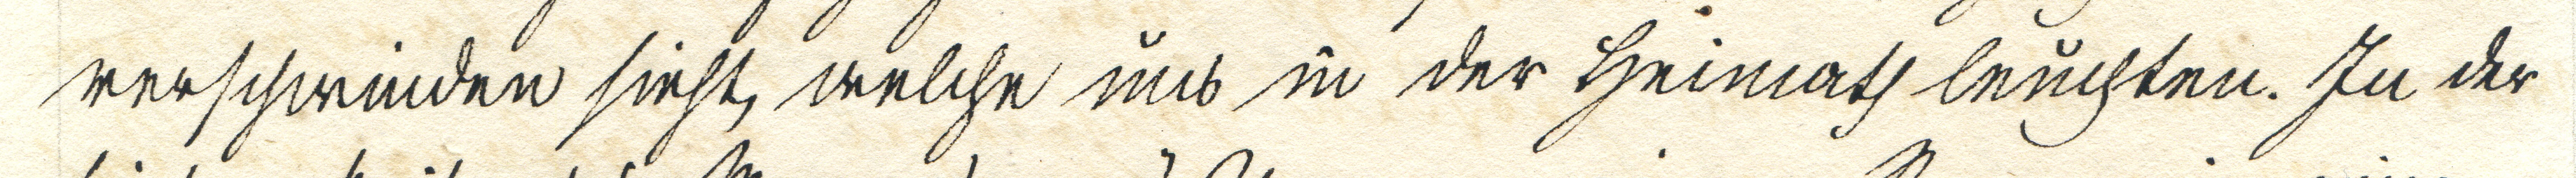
verschwinden sieht, welche uns in der Heimath leuchten. In der
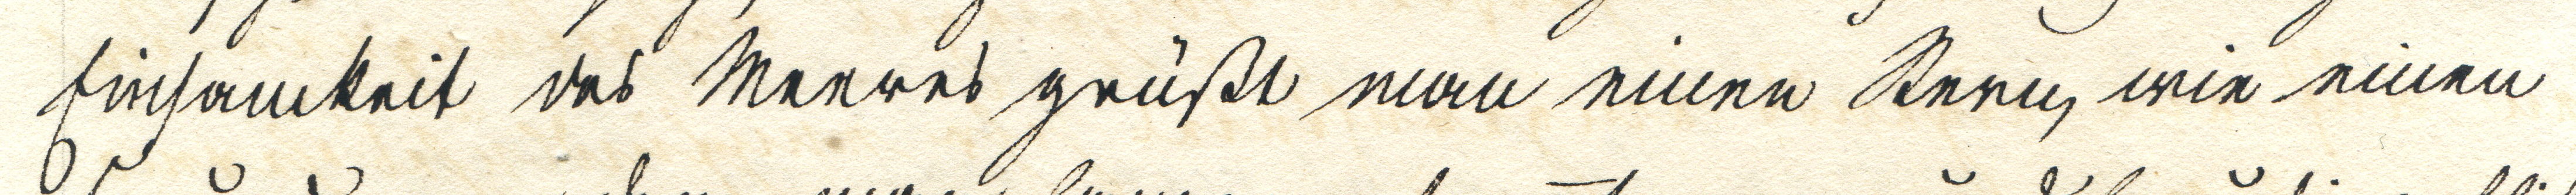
Einsamkeit des Meeres grüßt man einen Stern, wie einen
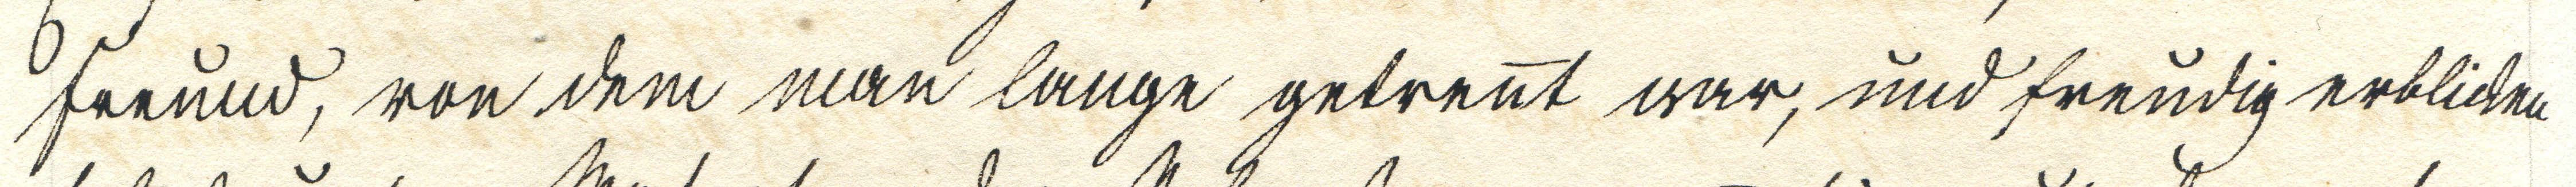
Freund, von dem man lange getreñt war, und freudig erblicken
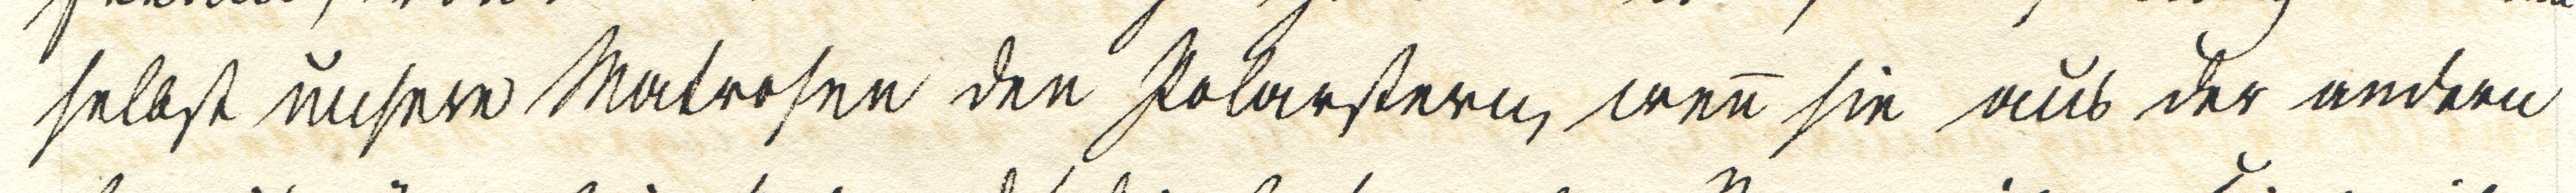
selbst unsere Matrosen den Polarstern, weñ sie aus der andern
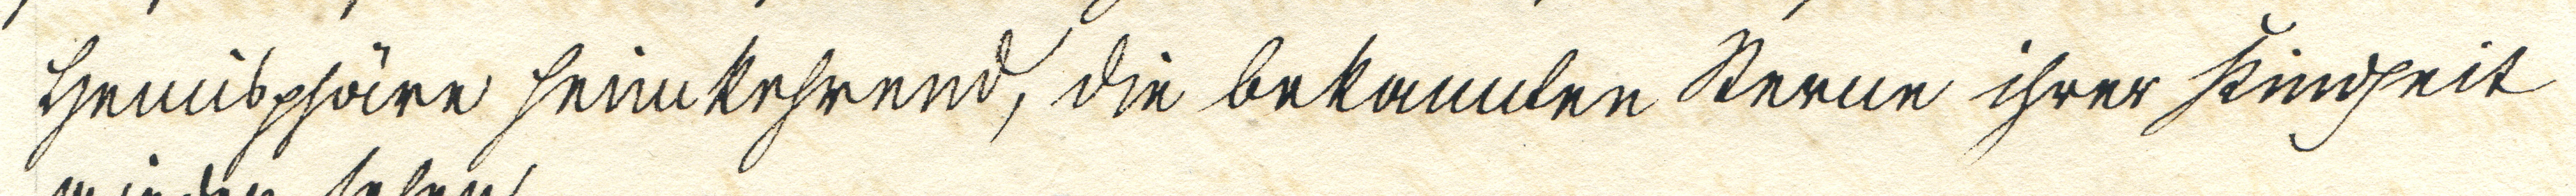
Hemisphäre heimkehrend, die bekannten Sterne ihrer Kindheit
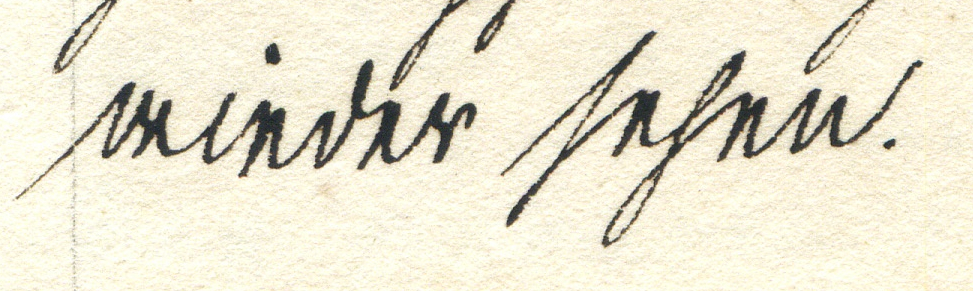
wieder sehen.
